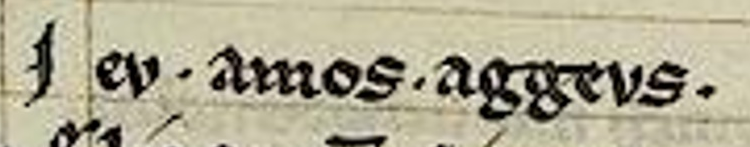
Iev. amos. aggevs.
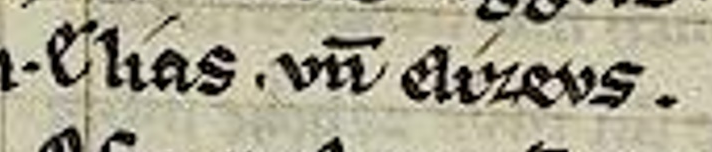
Elias. vn(d) elizevs.
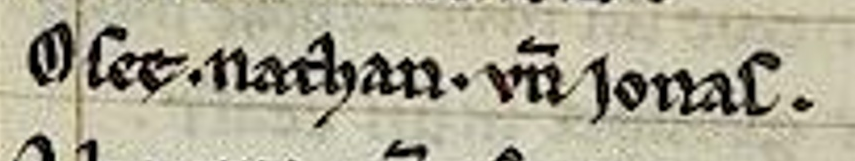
Oſee. nathan. vn(d) Jonaſ.
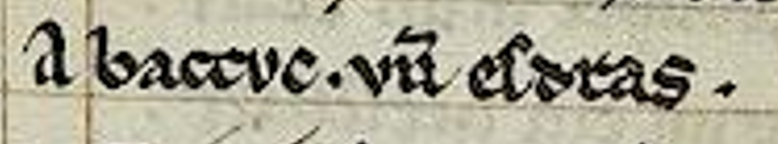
Abaccuc. vn(d) eſdras.
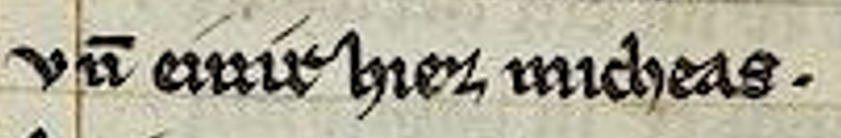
Vn(d) einir hiez micheas.
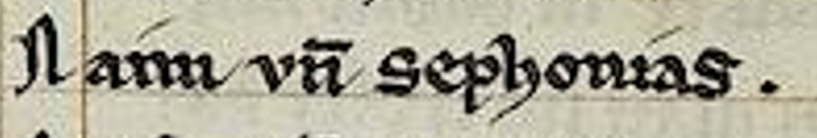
Naim vn(d) sephonias.
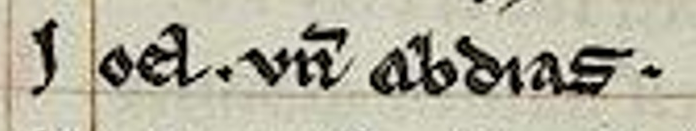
Joel. vn(d) abdias.
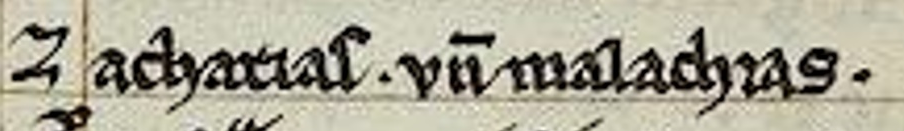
Zachariaſ. vn(d) malachias.
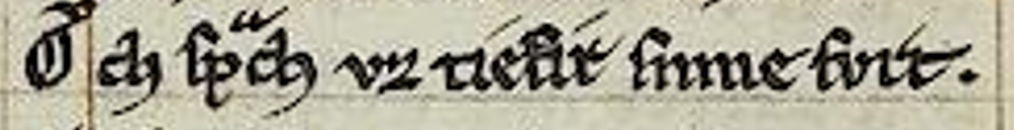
O°vch ſp(ra)ch vz tiefir ſinne fvrt.
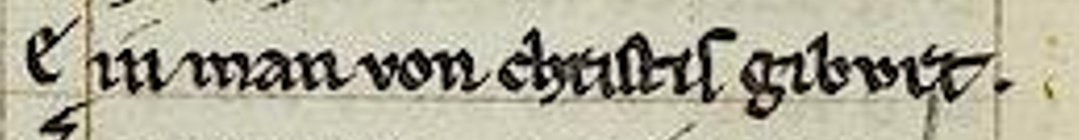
Ein man von christiſ gibvrt.
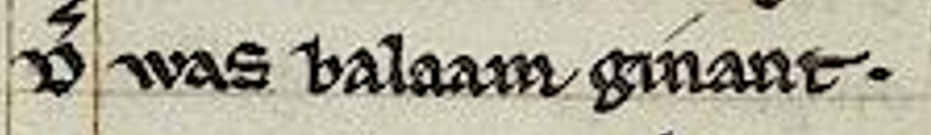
D(er) was balaam ginant.
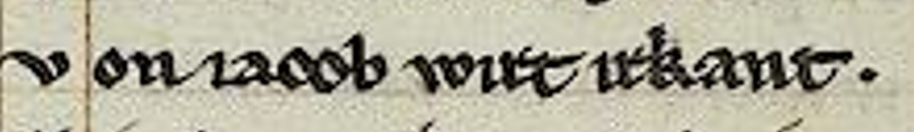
Von iacob wirt irkant.
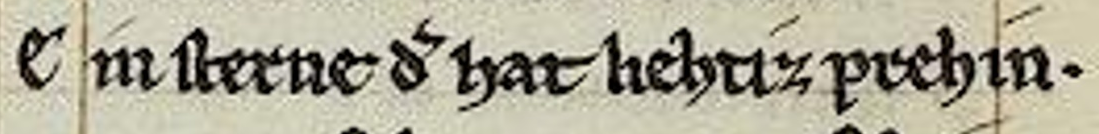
Ein ſterne d(er) hat liehtiz prehin.
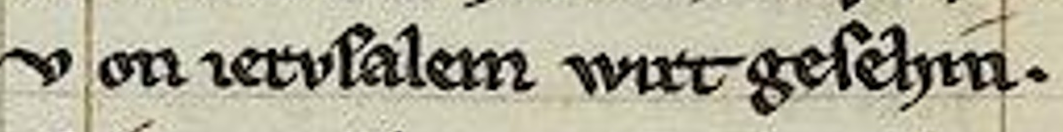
Von iervſalem wirt geſehin.
